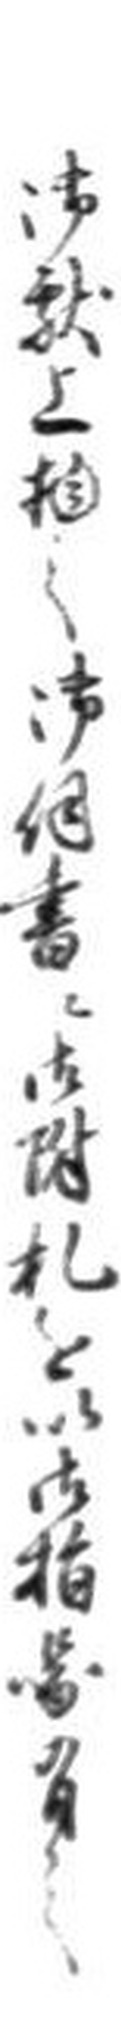御献上物之御伺書ニ御付札を以御指図有之
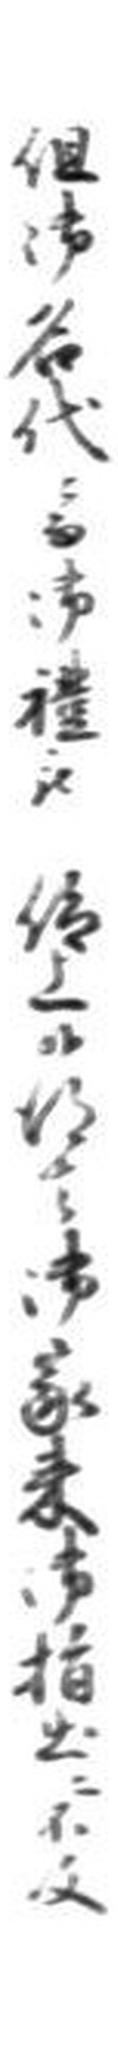但御名代ニ而御礼被仰上候得者御家来御指出ニ不及
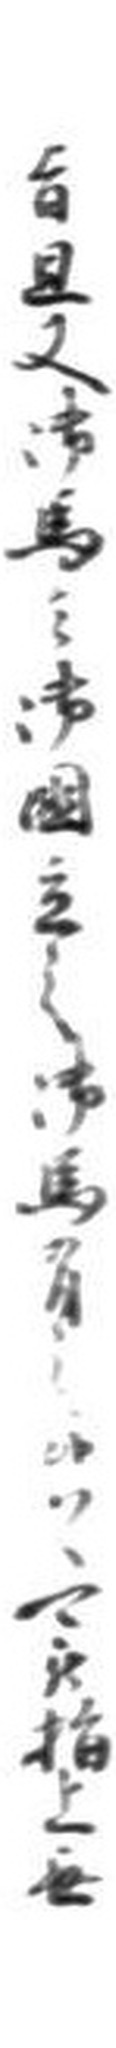旨且又御馬者御国立之御馬有之候ハヽ可被指上無
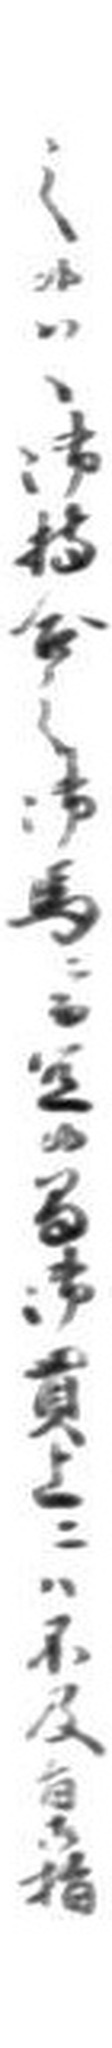之候ハヽ御持合之御馬ニ而宜候間御買上ニハ不及旨御指
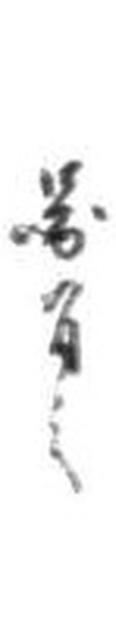図有之
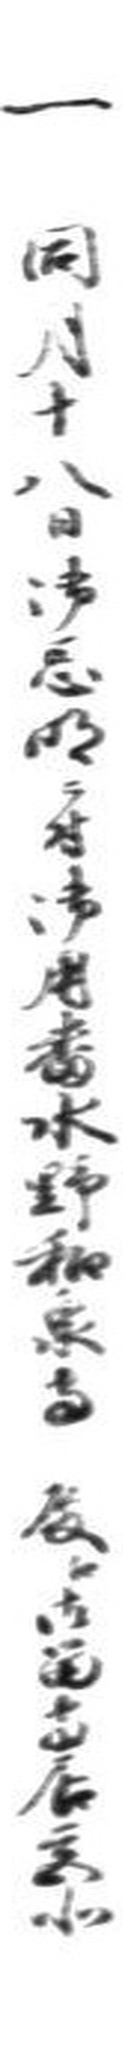一同月十八日御忌明ニ付御用番水野和泉守殿江御留守居宮北
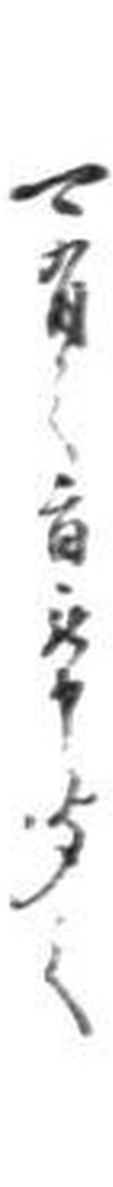可有之旨被申聞之
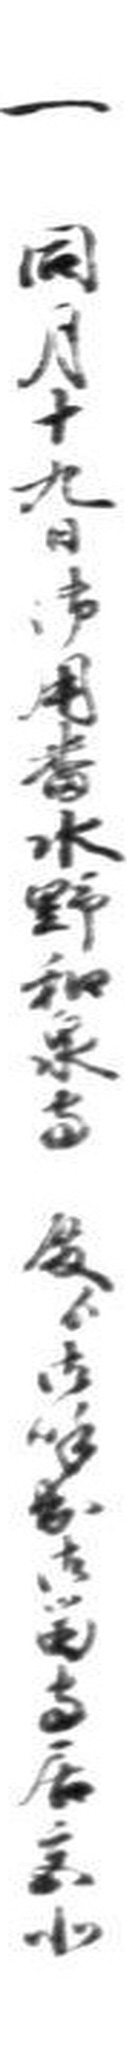一同月十九日御用番水野和泉守殿ゟ御呼出御留守居宮北

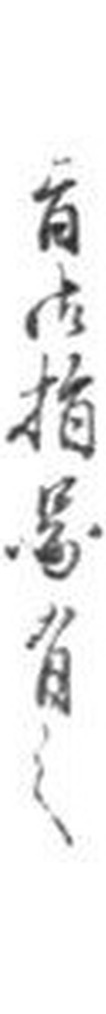旨御指図有之
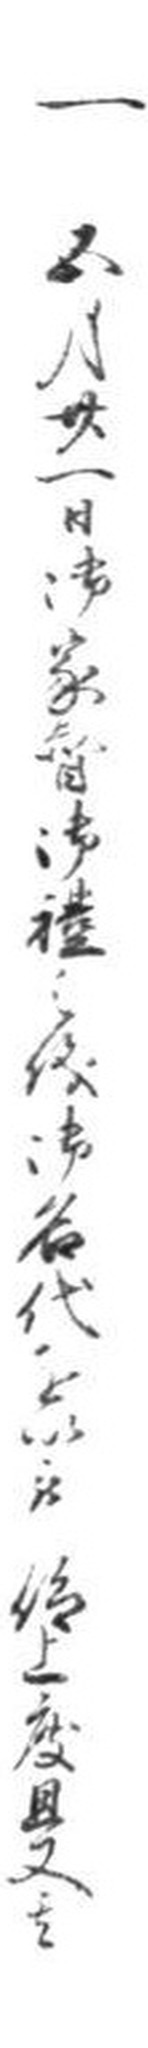一五月廿一日御家督御礼之儀御名代を以被仰上度且又其
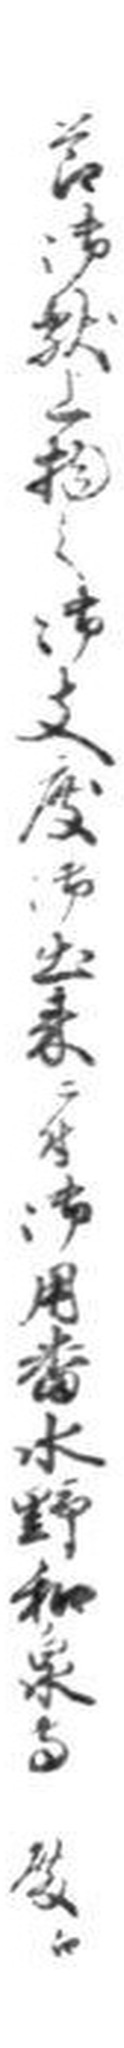節御献上物之御支度御出来ニ付御用番水野和泉守殿江
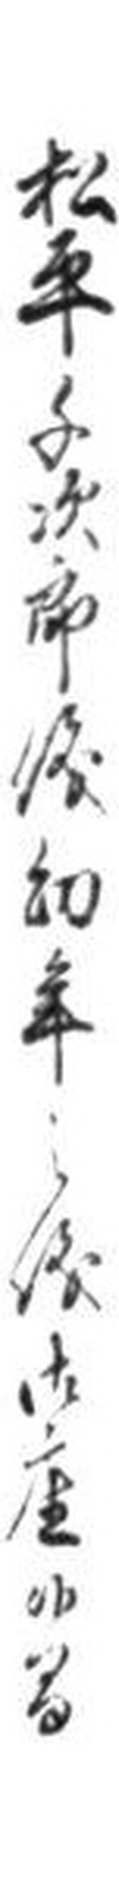松平千次郎儀幼年之儀御座候間
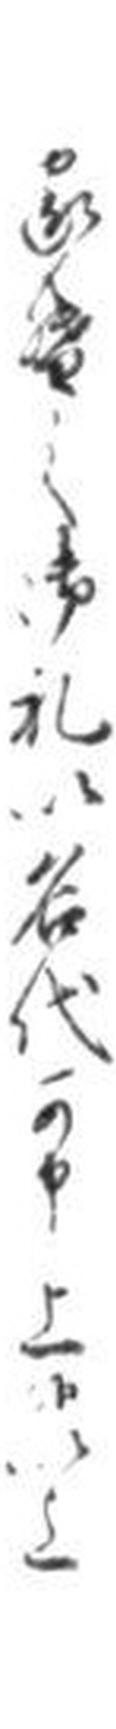家督之御礼以名代可申上候以上
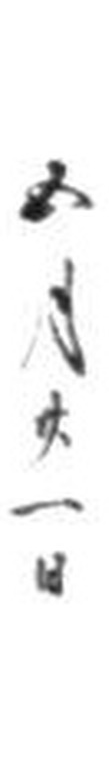五月廿一日
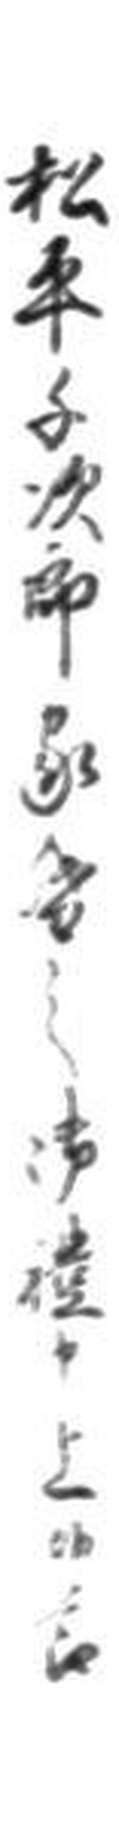松平千次郎家督之御礼申上候節
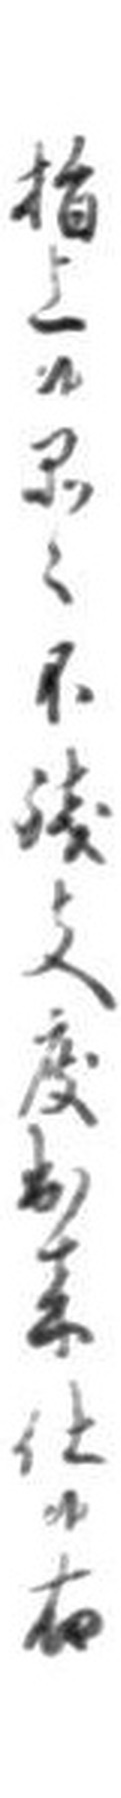指上候品々不残支度出来仕候右
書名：家譜 三十八 宗矩公 従享保九年五月到享保九年十二月
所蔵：福井県文書館 Fukui Prefectural Archives
